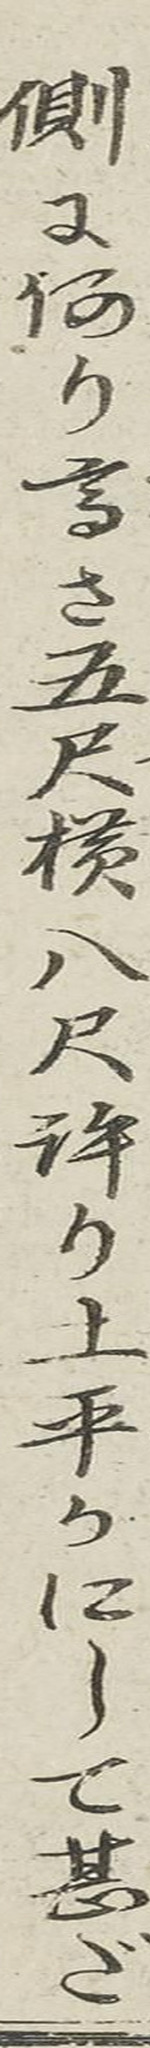側にあり高さ五|尺横八尺許り上平かにして甚だ

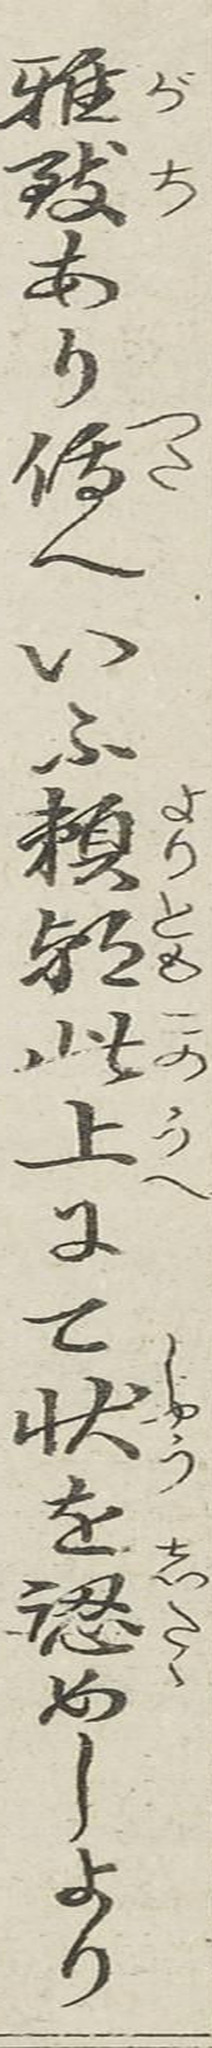雅致あり伝へいふ頼朝此上にて状を認めしより
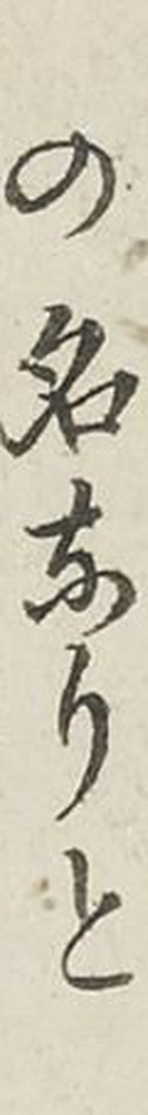の名なりと
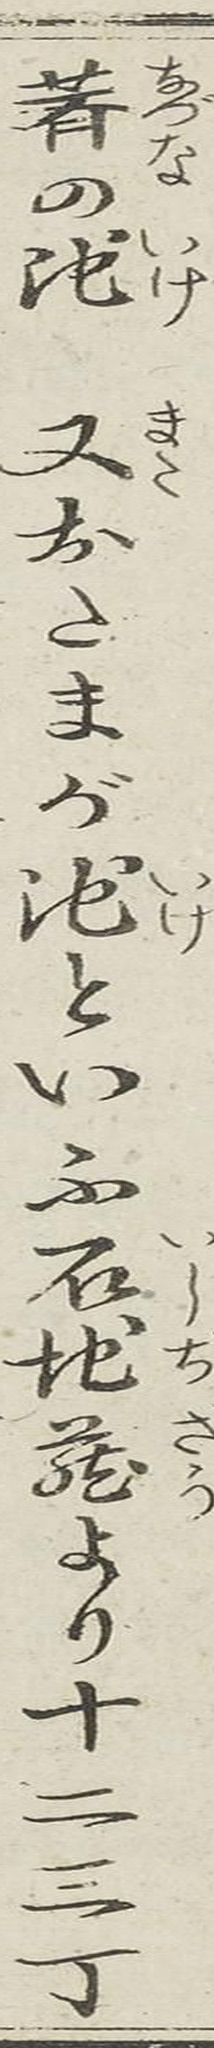薺の池又おたまが池といふ石地蔵より十二三丁
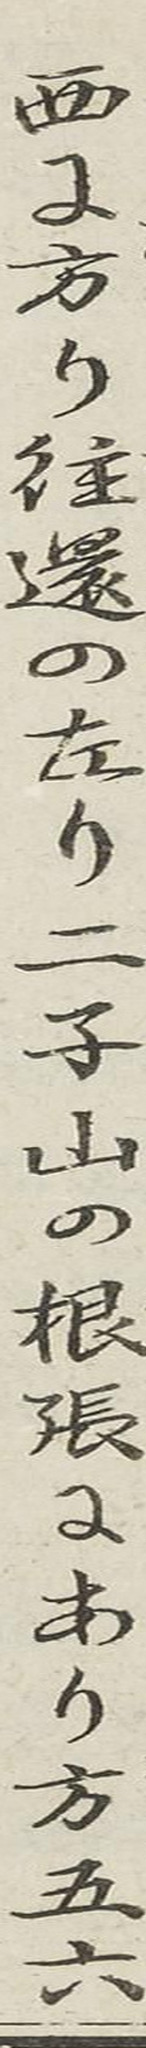西に方り往還の左り二子山の根張にあり方五六
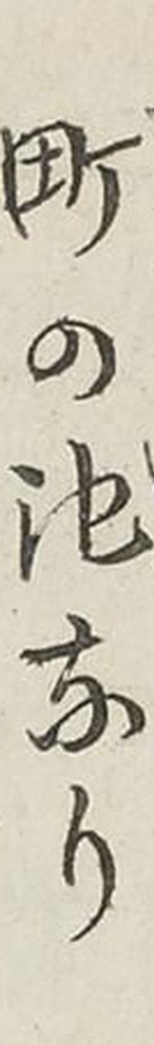町の池なり
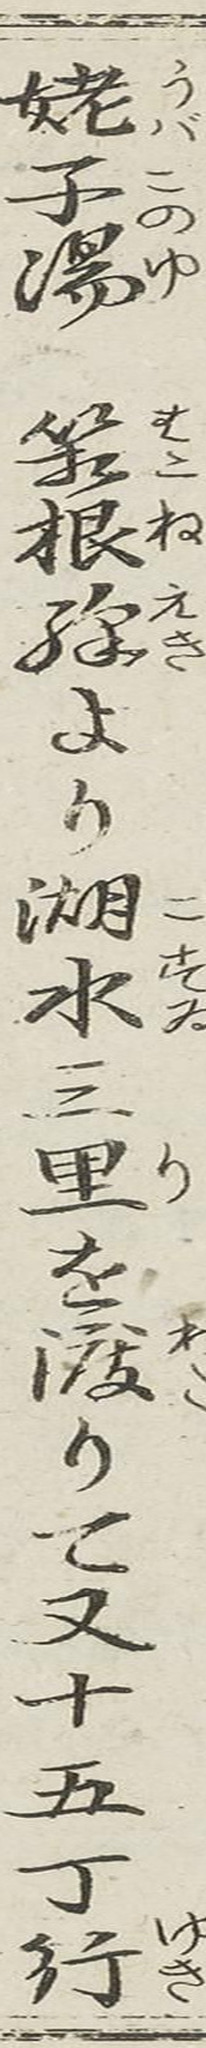姥子湯箱根駅より湖水三里を渡りて又十五丁行
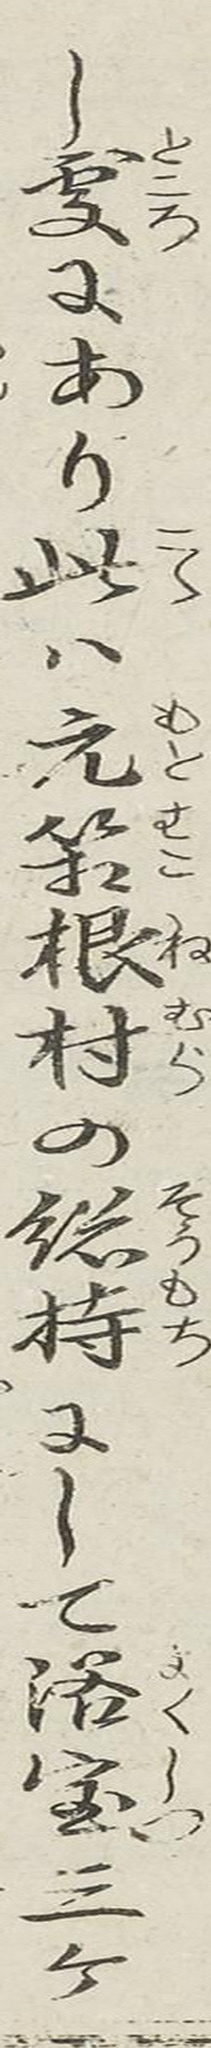し処にあり此は元箱根村の総持にして浴室三ケ
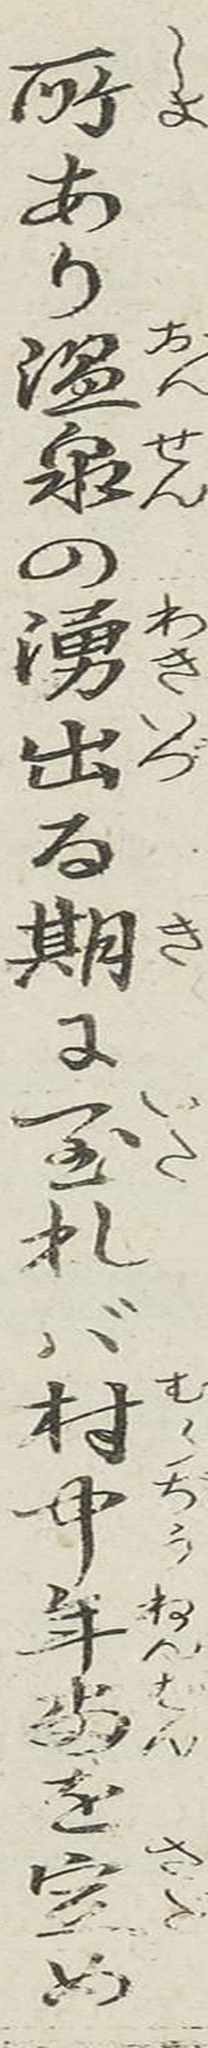所あり温泉の湧出る期に至れば村中年番を定め
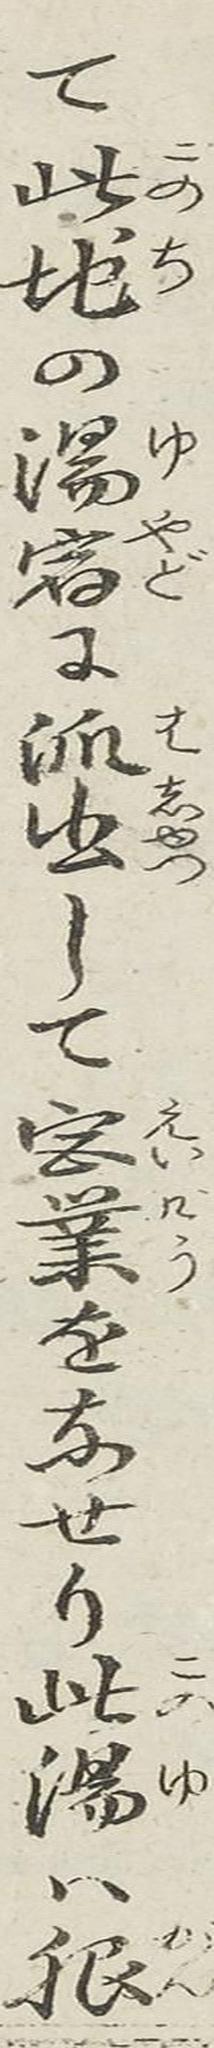て此地の湯宿に派出して営業をなせり此湯は眼
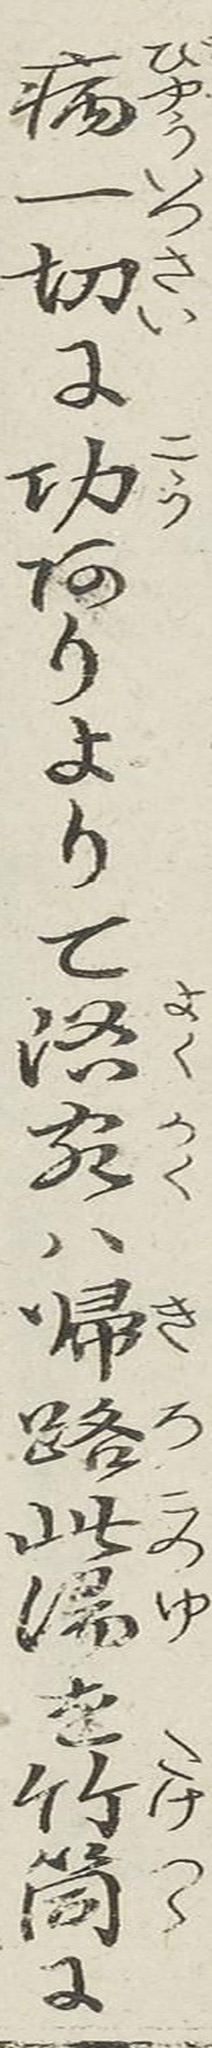病一切に功ありよりて浴客は帰路此湯を竹筒に
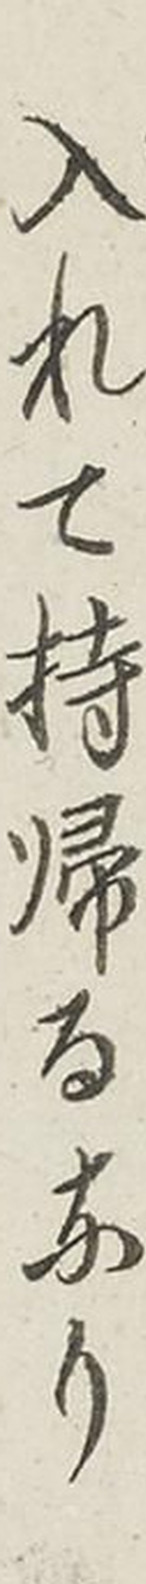入れて持帰るなり
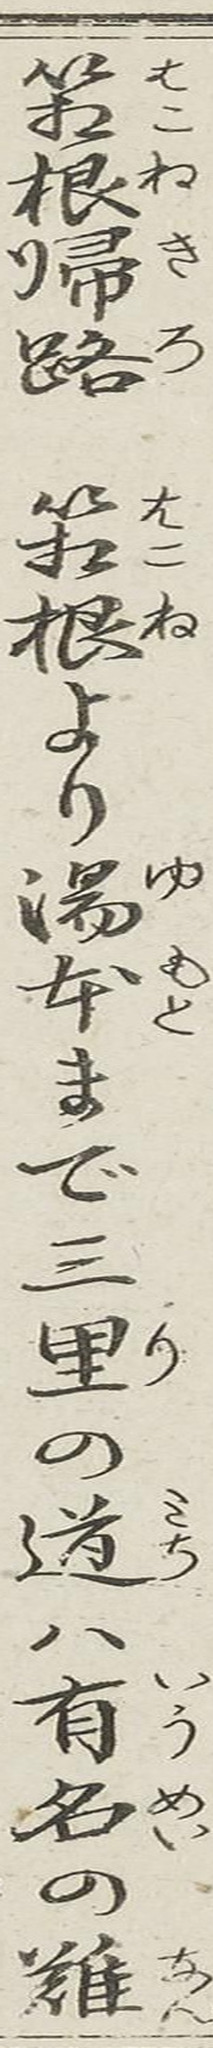箱根帰路箱根より湯本まで三里の道は有名の難
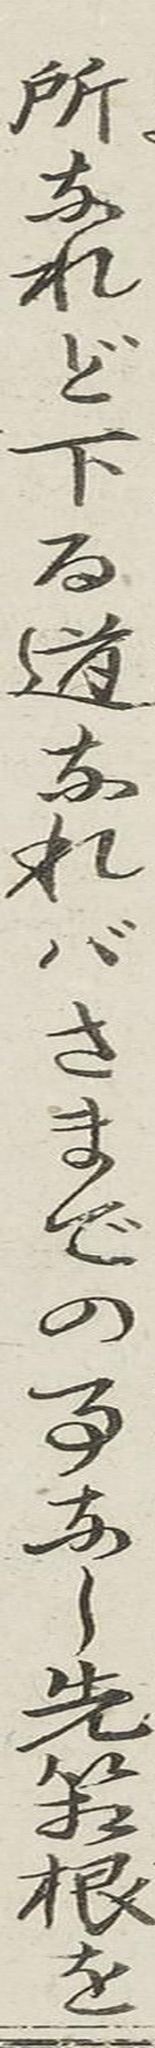所なれど下る道なればさまでの事なし先箱根を
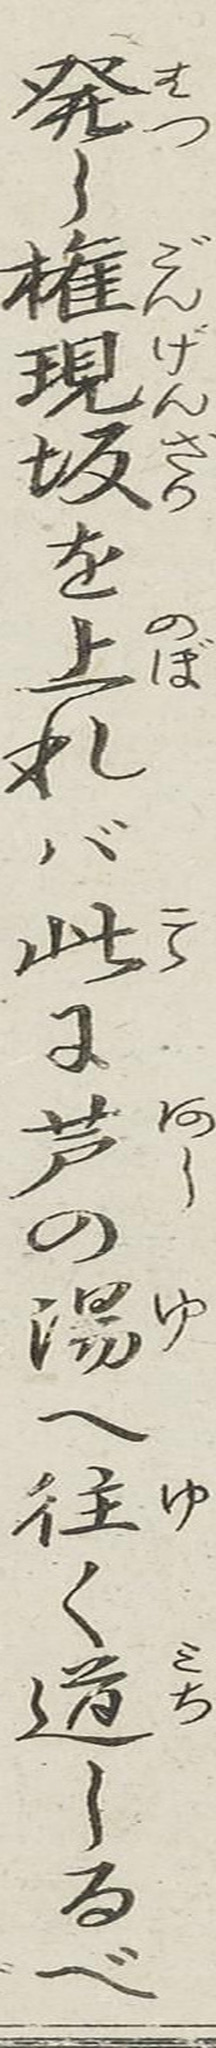発し権現坂を上れば此に芦の湯へ往く道しるべ
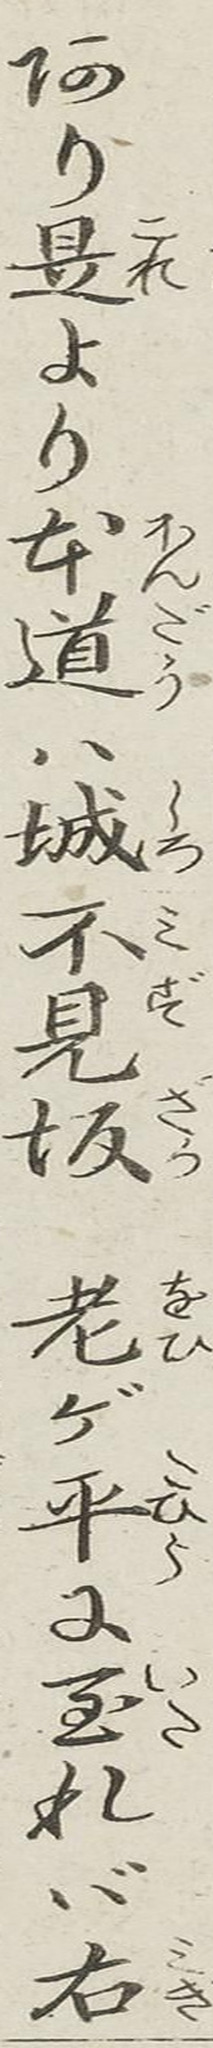あり是より本道は城不見坂老ゲ平に至れば右
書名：箱根温泉誌　全
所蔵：東京大学地震研究所図書室 Earthquake Research Institute Library, The University of Tokyo, JAPAN
